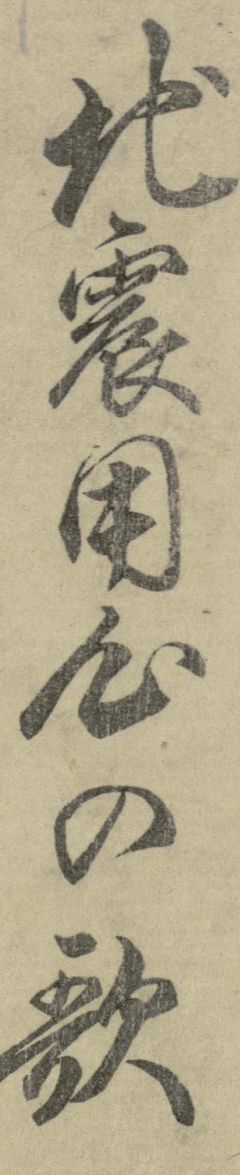地震用心の歌
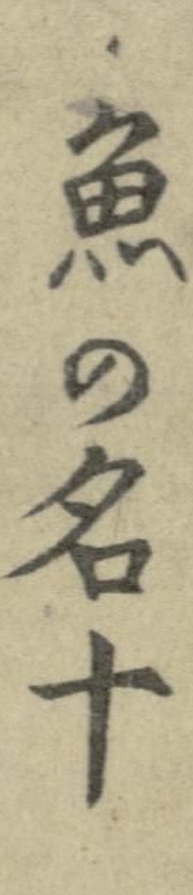魚の名十
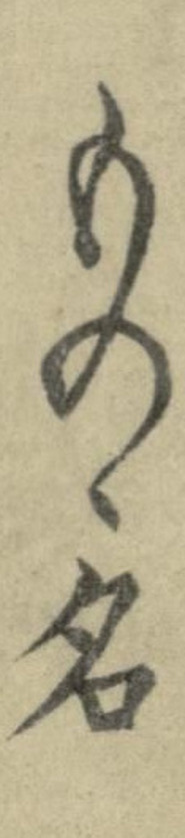ものゝ名
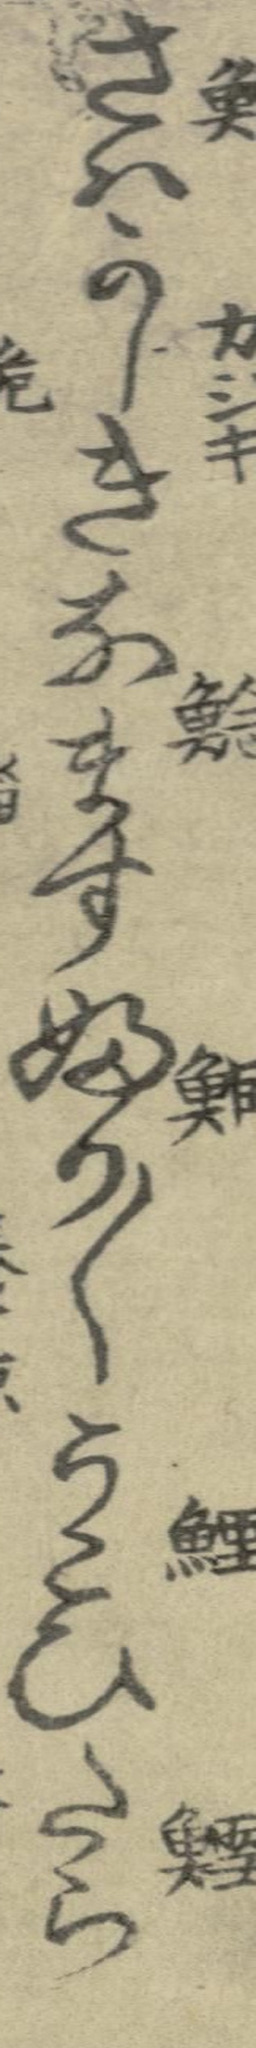さはかしきなますふり〳〵うこひたら
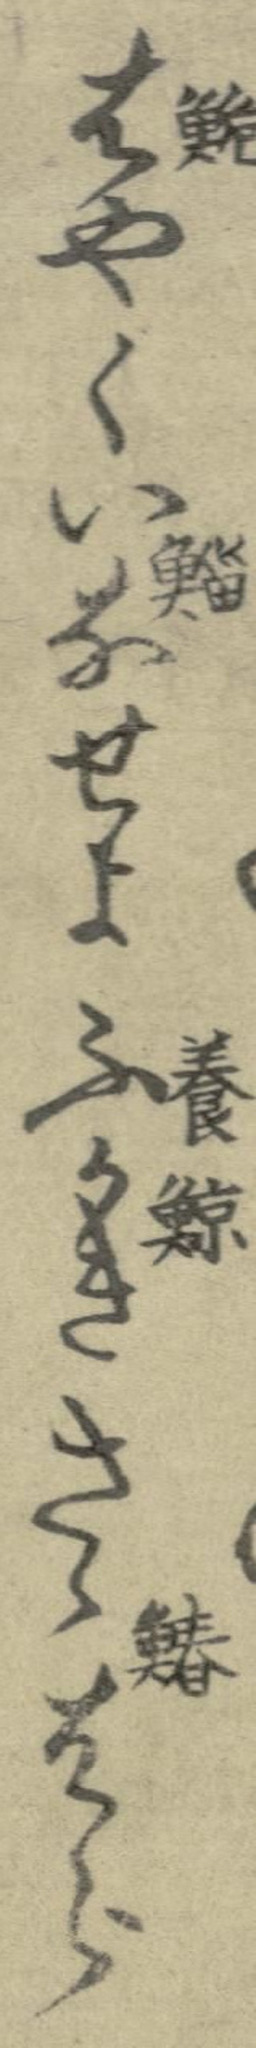はやくいなせよふかきさゝはら
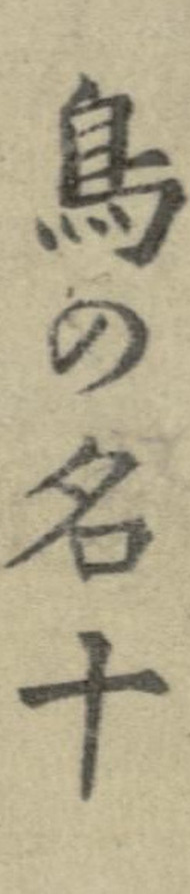鳥の名十
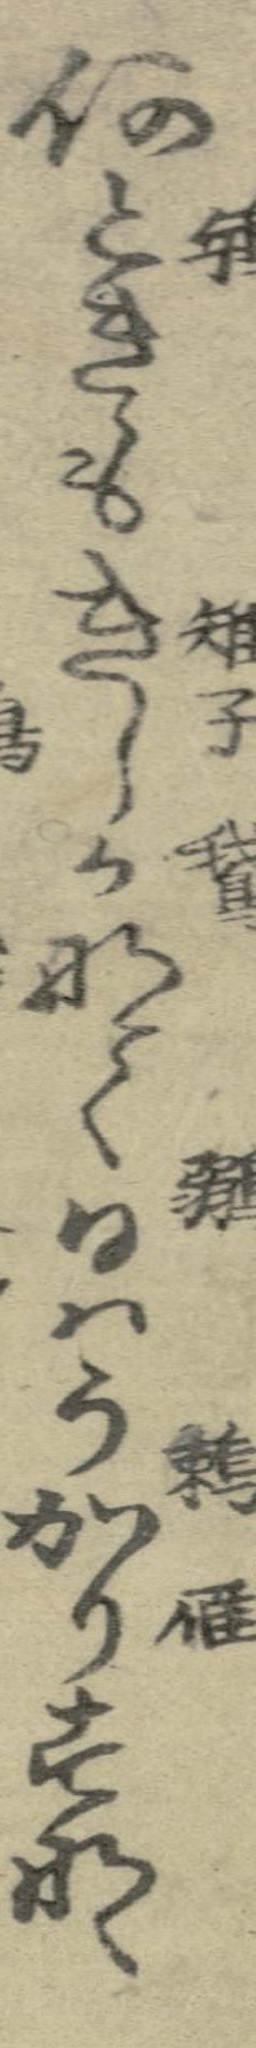何ときもきしかなく日はうかりすな
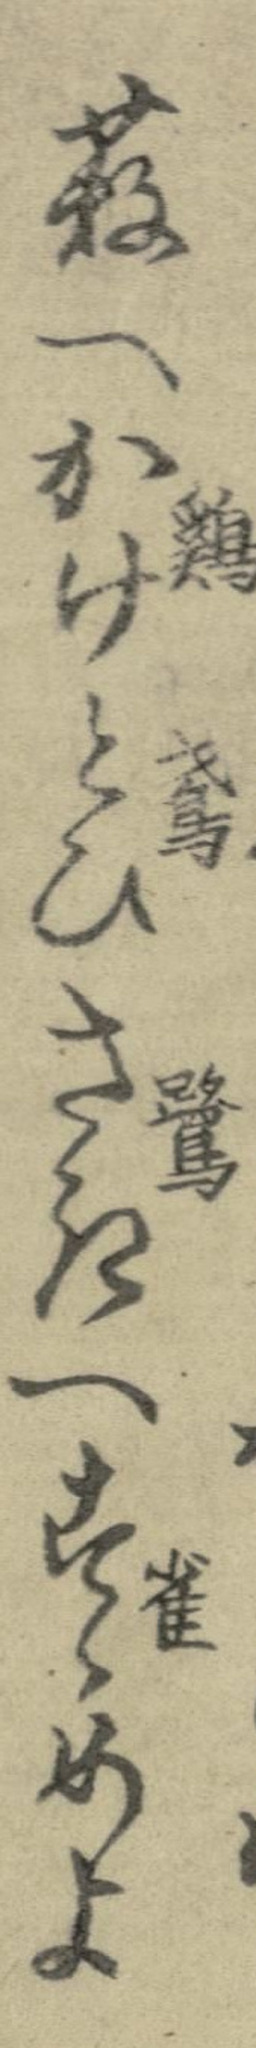藪へかけとひさきへすゝめよ
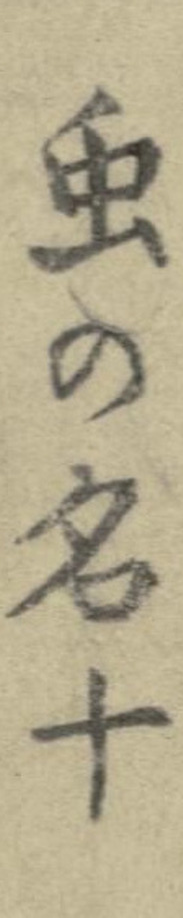虫の名十
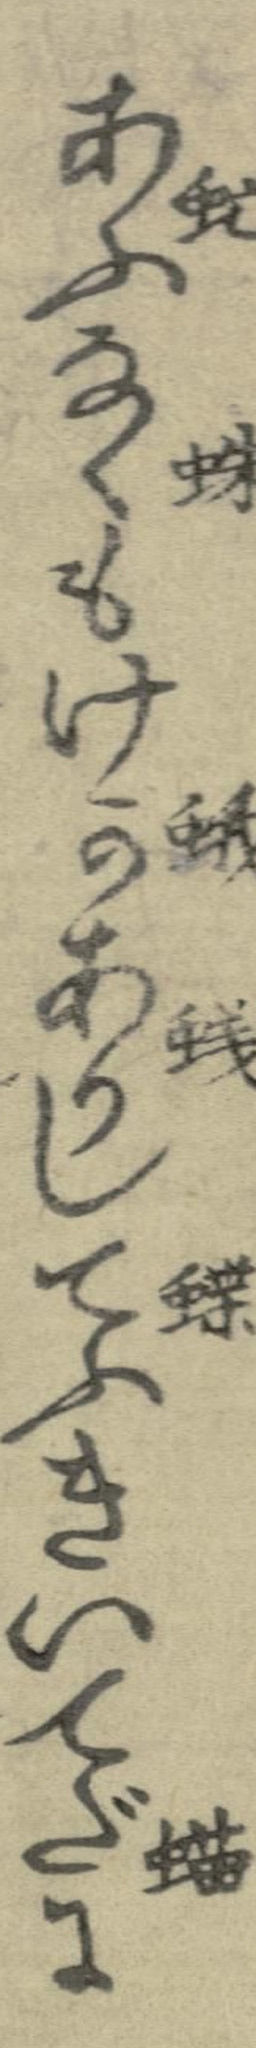あふなくもけかありしてふきいてだに
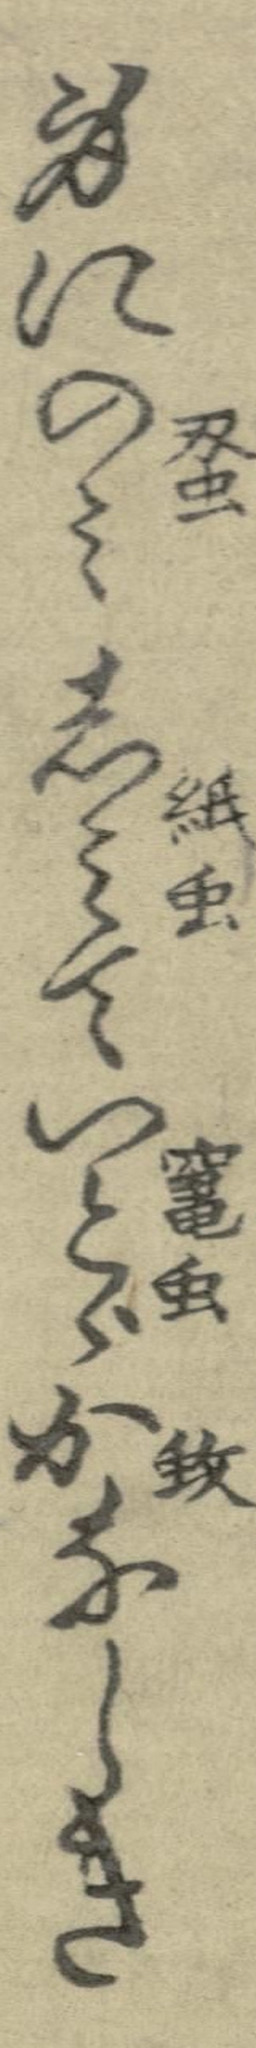身にのみしみていとゞかなしき
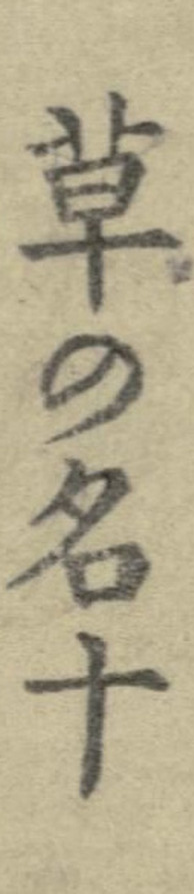草の名十
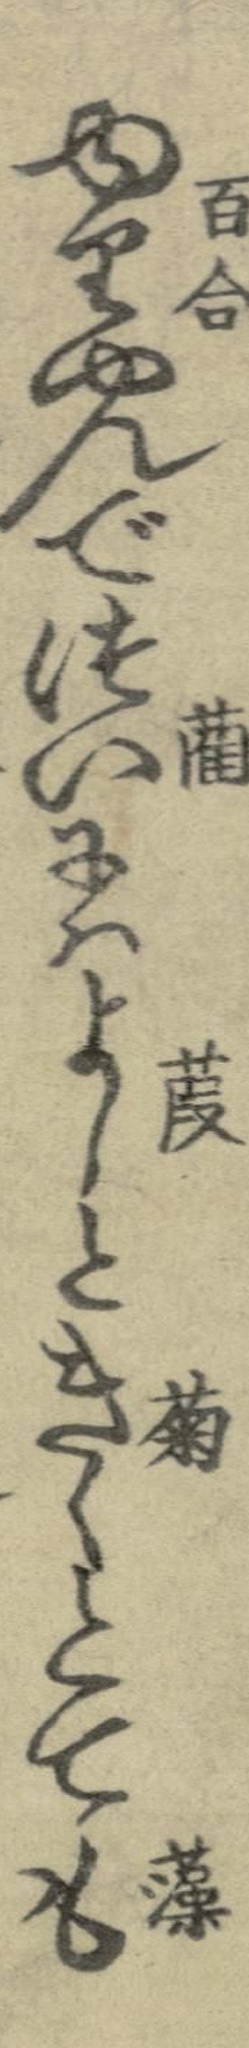ゆりやんでついにはよしときくとても
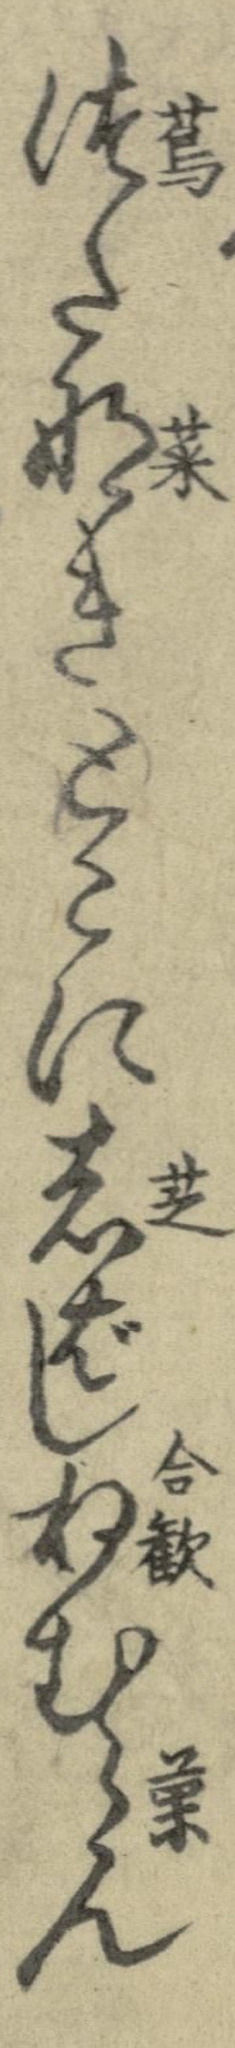つたなきとこにしばしねむらん
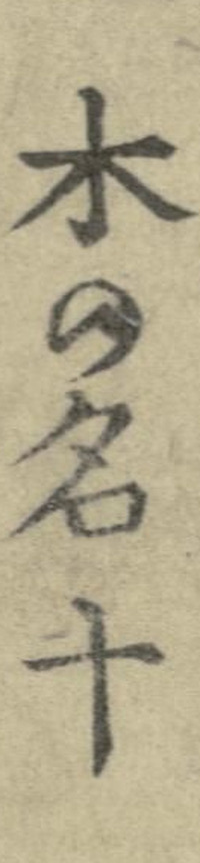木の名十
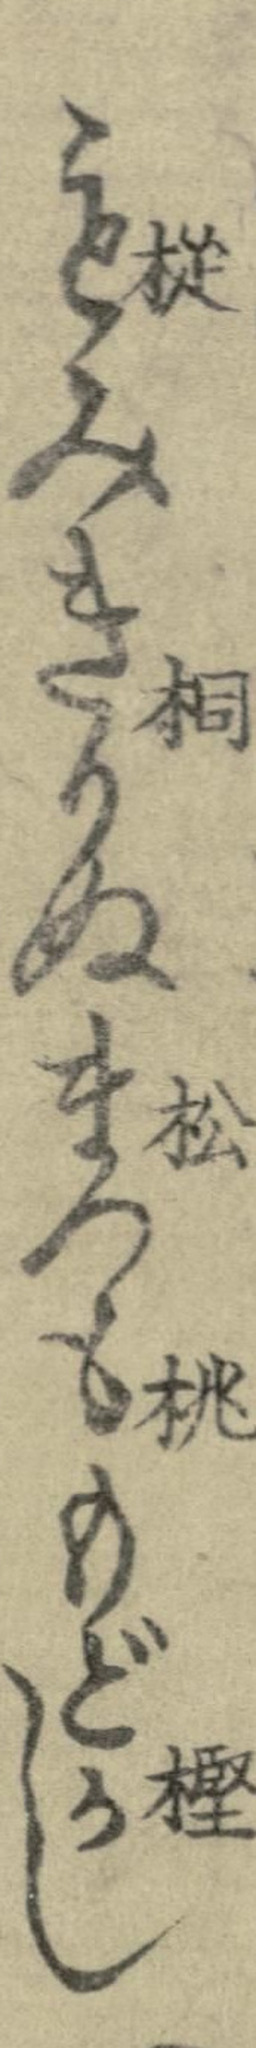もみきりぬまつももどかし
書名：地震用心の歌
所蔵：東京大学地震研究所図書室 Earthquake Research Institute Library, The University of Tokyo, JAPAN
